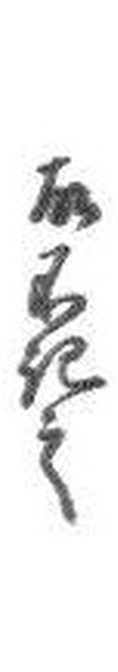故不記之
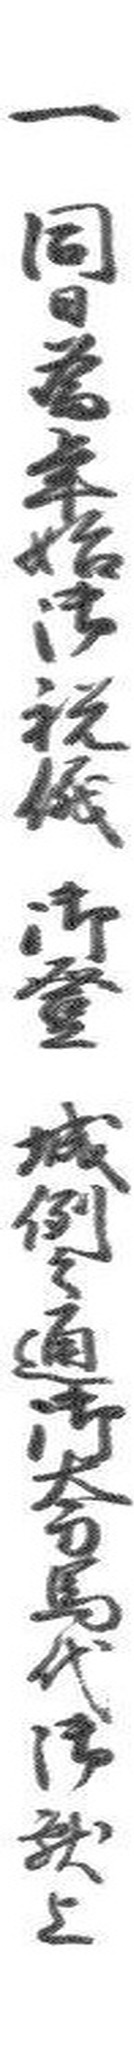一同日為年始御祝儀御登城例之通御太刀馬代御献上
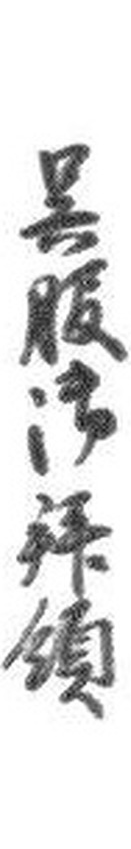呉服御拝領

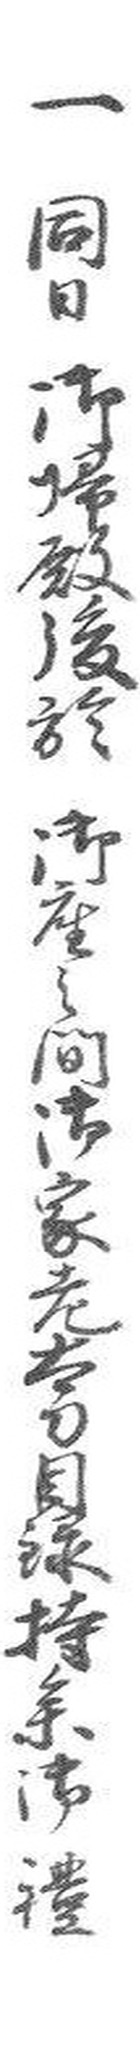一同日御帰殿後於御座之間御家老太刀目録持参御礼
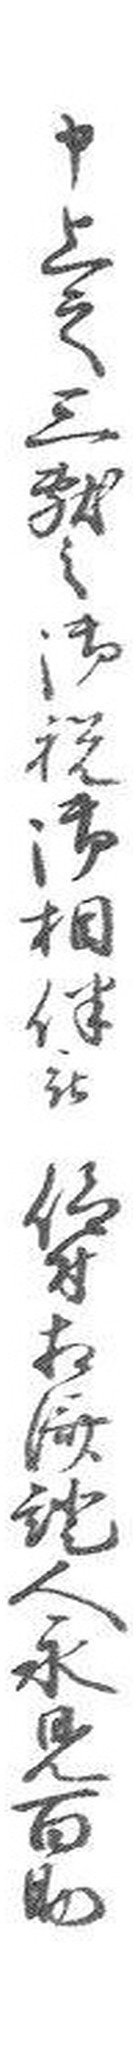申上之三献之御祝御相伴被仰付相済證人永見百助
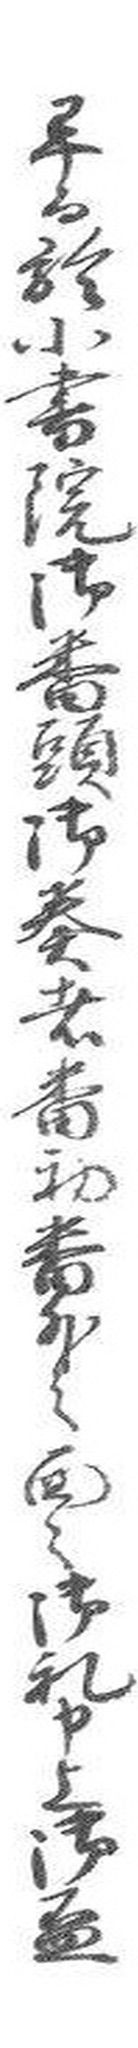畢而於小書院御番頭御奏者番初番外之面々御礼申上御盃
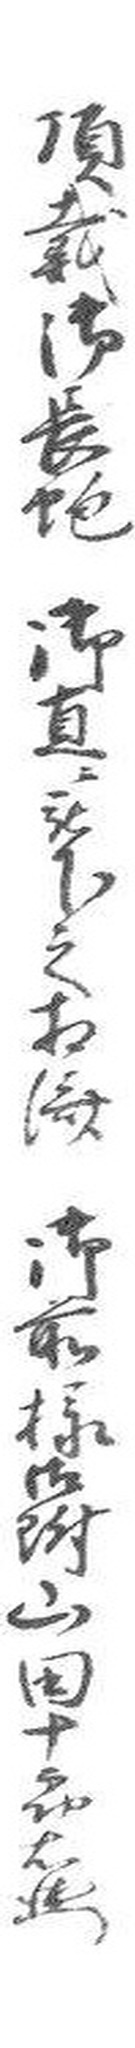頂戴御長蚫御直ニ被下之相済御前様御附山田十郎右衛門
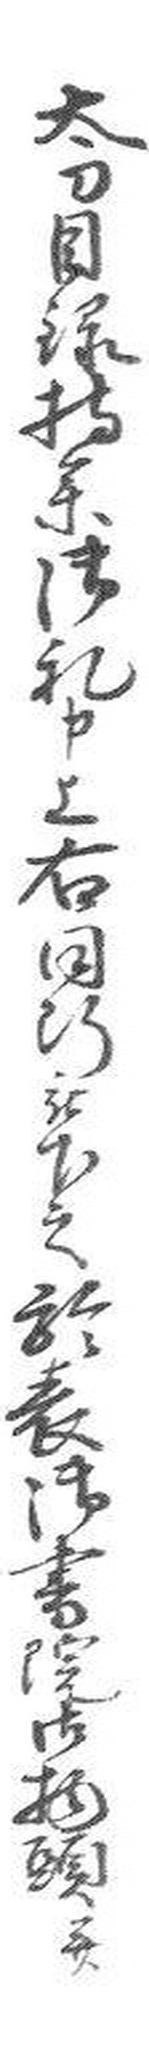太刀目録持参御礼申上右同断被下之於表御書院御物頭并
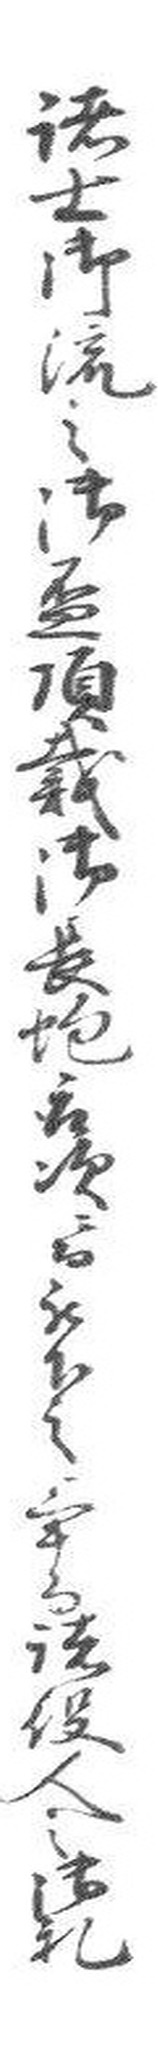諸士御流之御盃頂戴御長蚫取次ニ而被下之畢而諸役人之御礼
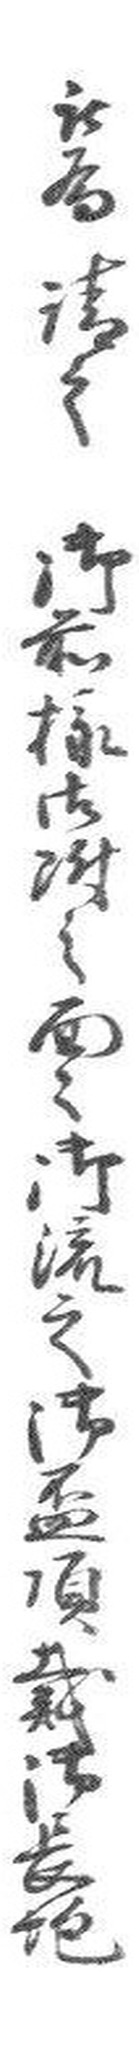被為請之御前様御附之面々御流之御盃頂戴御長蚫
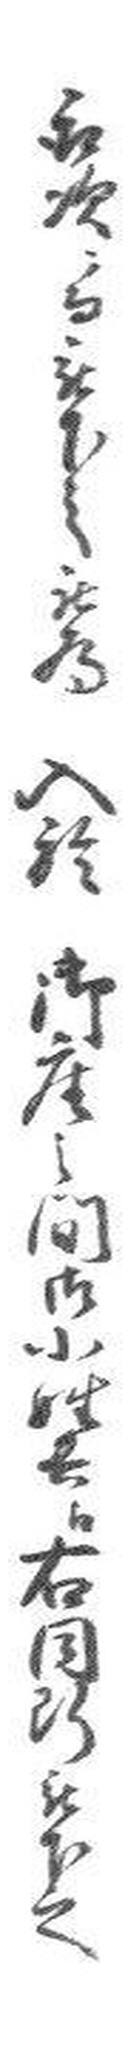取次ニ而被下之被為入於御座之間御小姓共江右同断被下之
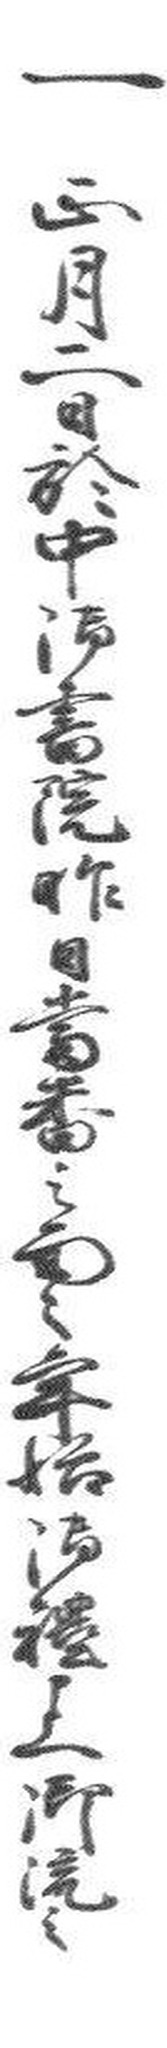一正月二日於中御書院昨日当番之面々年始御礼申上御流之
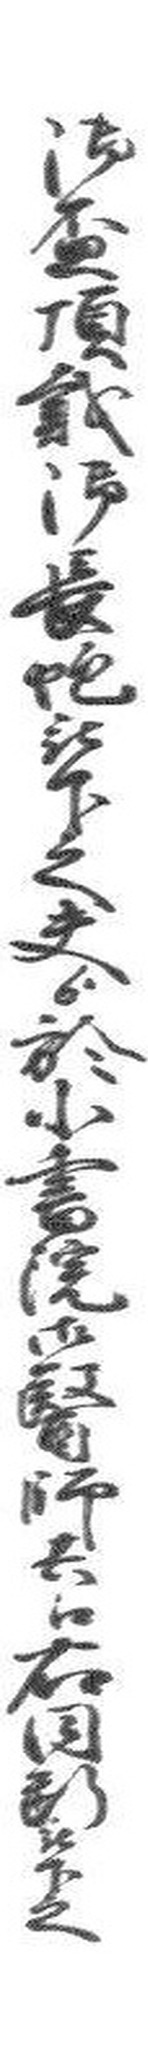御盃頂戴御長蚫被下之夫ゟ於小書院御医師共江右同断被下之
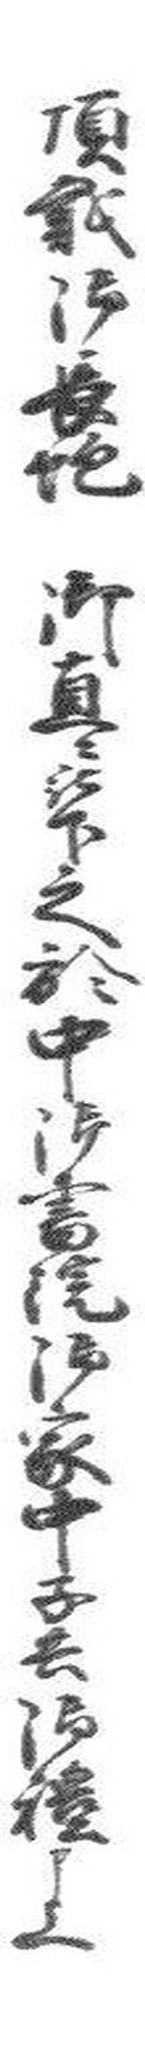頂戴御長蚫御直ニ被下之於中御書院御家中子共御礼申上
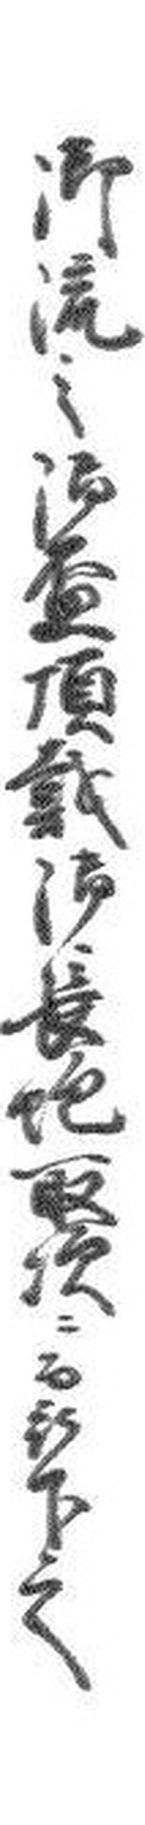御流之御盃頂戴御長蚫取次ニ而被下之
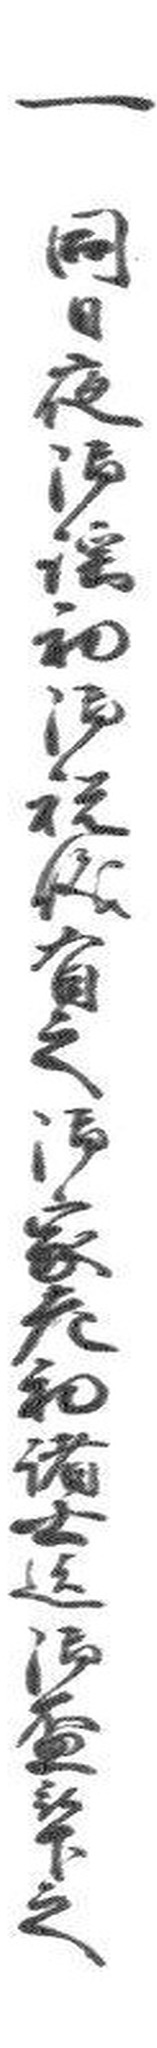一同日夜御謡初御祝儀有之御家老初諸士迄御盃被下之
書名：家譜 六 光通公 従万治三年到寛文三年
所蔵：福井県文書館 Fukui Prefectural Archives
